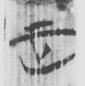正
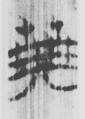典
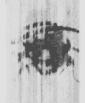獄
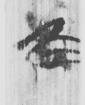隹
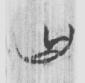曰
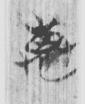{卉叀}
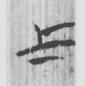上
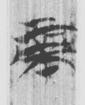帝
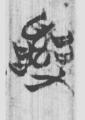𠧏（亂）
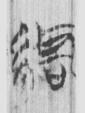紿
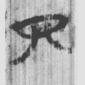四
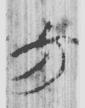方
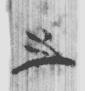之
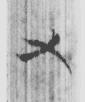又
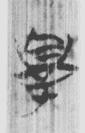辠
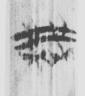無
